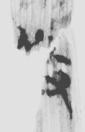攸
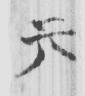亓
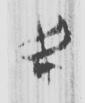民
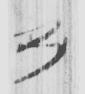乃
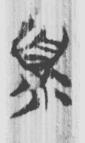寡
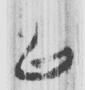㠯（以）
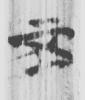不
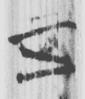正
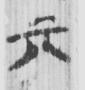亓
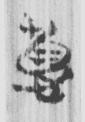惪
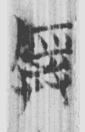{厂丵廾}
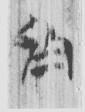於
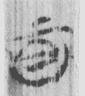百
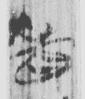眚
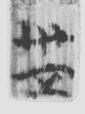{卅五}
